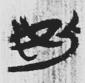{女匕}（焉）
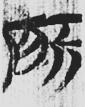所
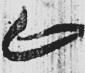㠯
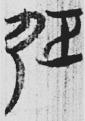○（距）
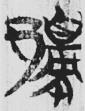○（邊）
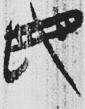母
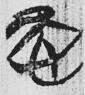○〈○-愛〉
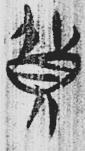貨
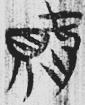資
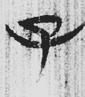子
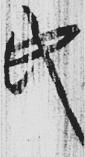女
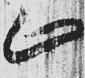㠯
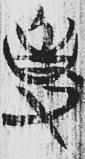事
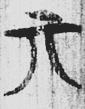亓
